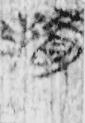○（瘥）
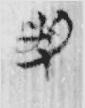受
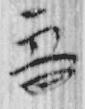○（期）
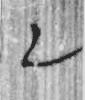乙
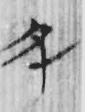丑
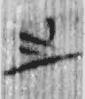之
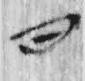日
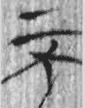不
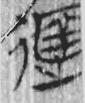𬨭（將）
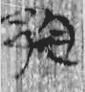陰
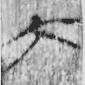大
